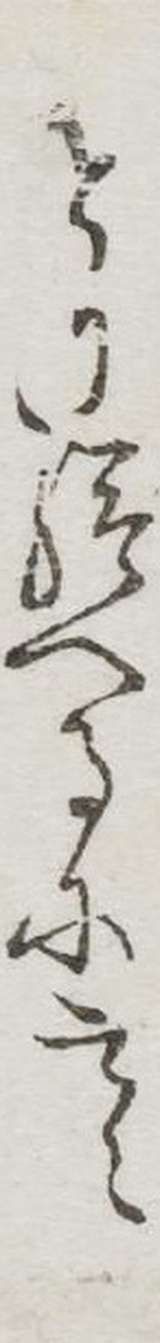とり給へるに云々
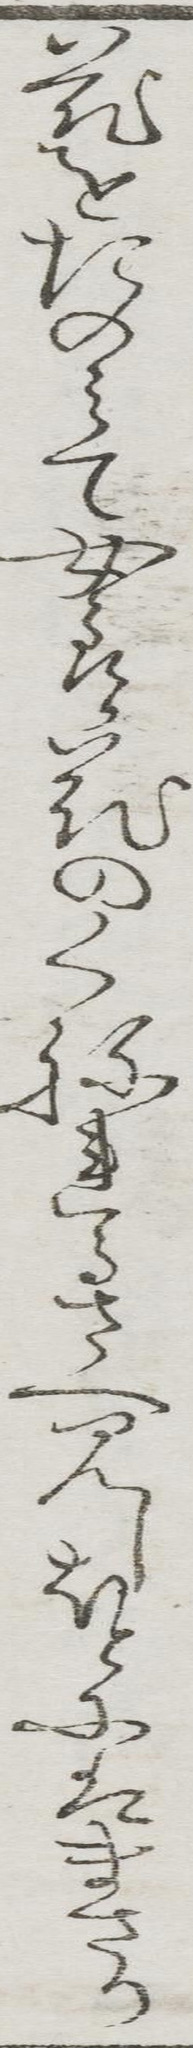花をたのみて女郎花のくねれるさへ見しほとにはまさり
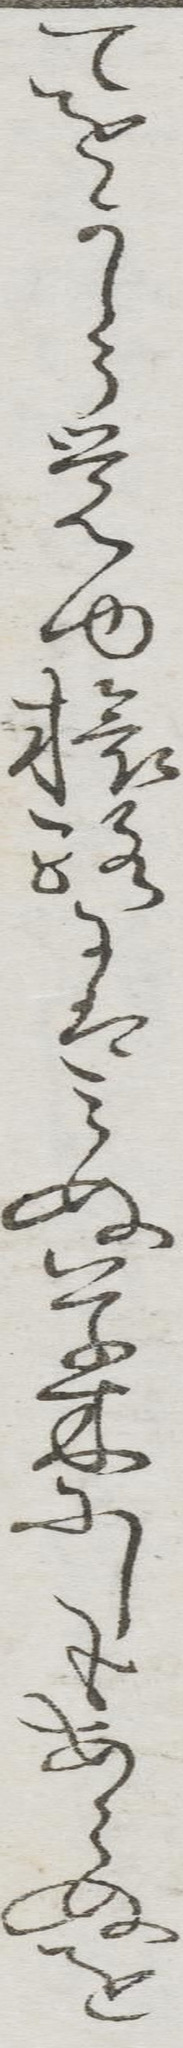てをかしう覚ゆ旅路にはみぬ草木にしもあらぬを
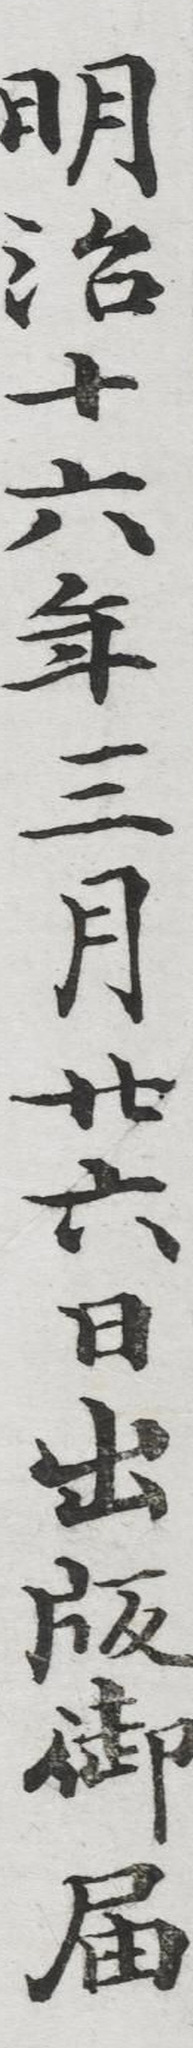明治十六年三月廿六日出版御届
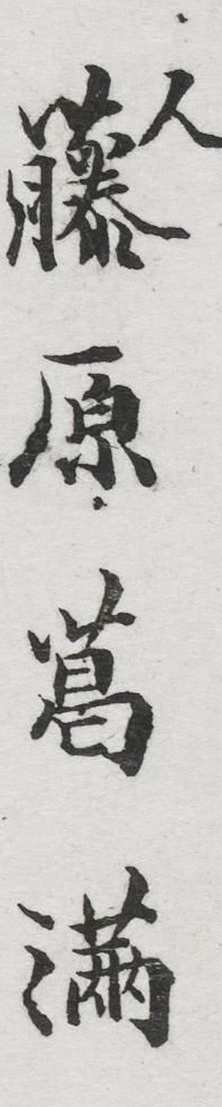藤原葛満
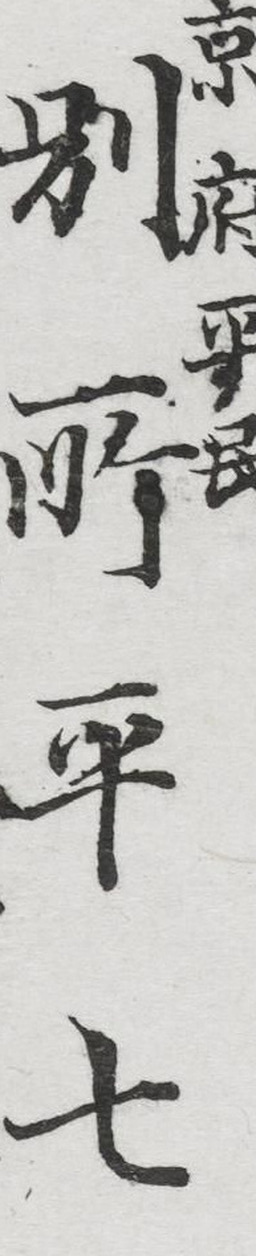別所平七
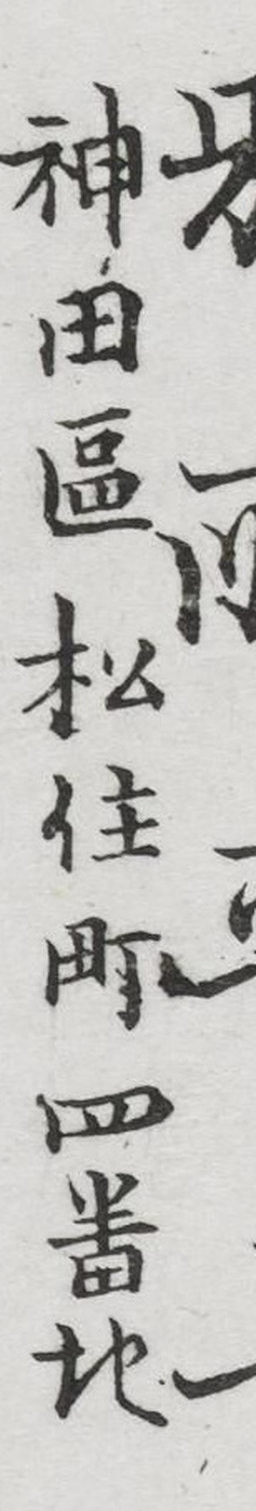神田区松住町四番地
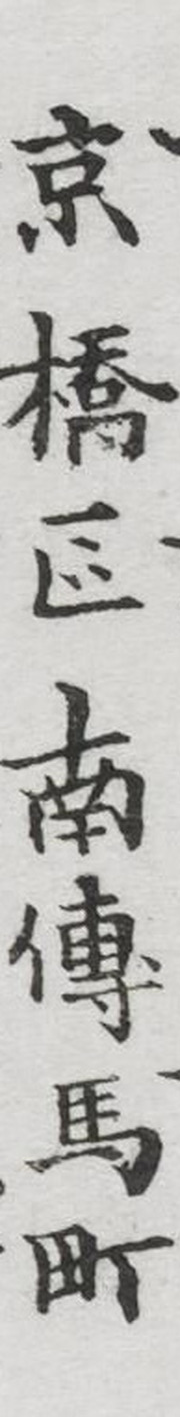京橋区南伝馬町
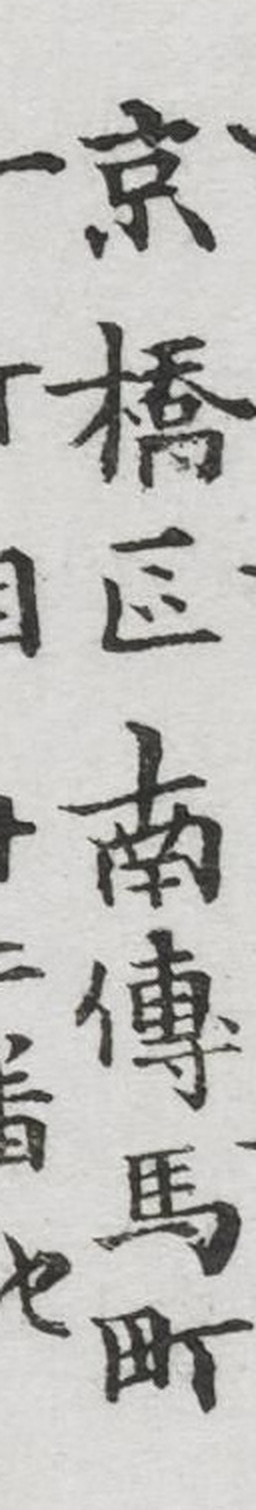京橋区南伝馬町
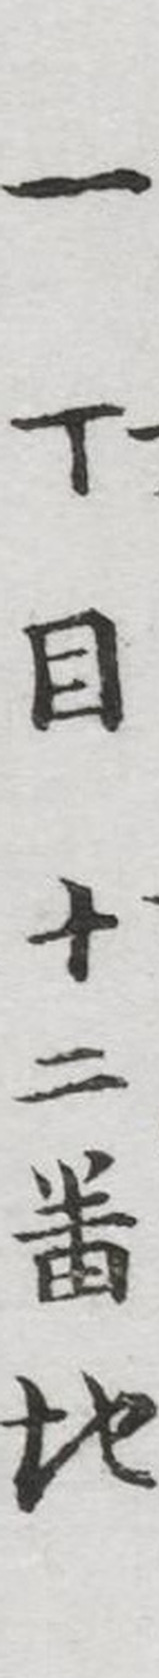一丁目十二番地
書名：挿画熱海日記　全
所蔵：東京大学地震研究所図書室 Earthquake Research Institute Library, The University of Tokyo, JAPAN
